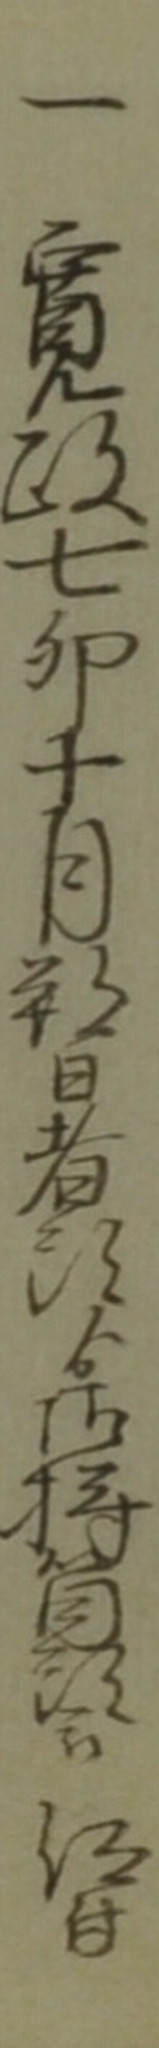一寛政七卯十月朔日者頭ゟ御持筒頭被仰付
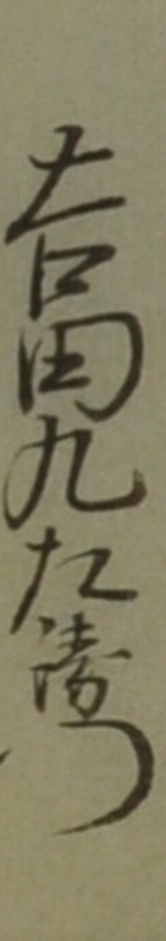吉田九左衛門
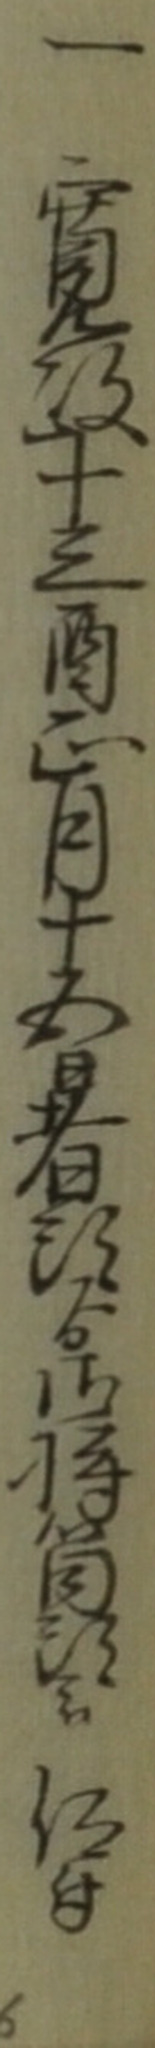一寛政十三酉正月十五日者頭ゟ御持筒頭被仰付
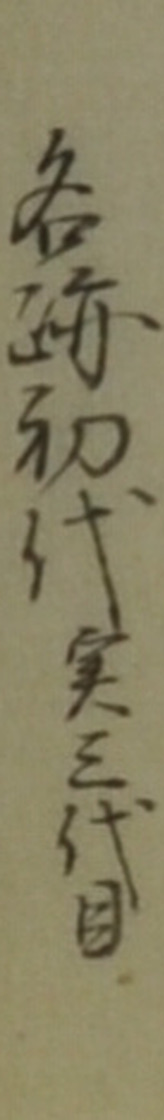名跡初代実三代目
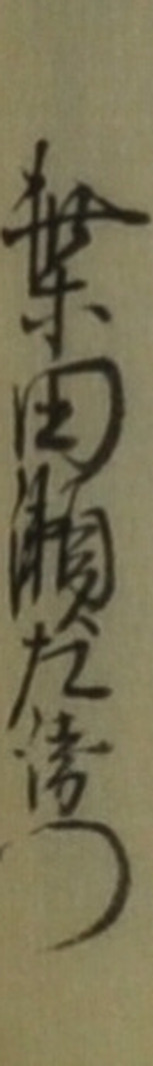葉田瀬左衛門
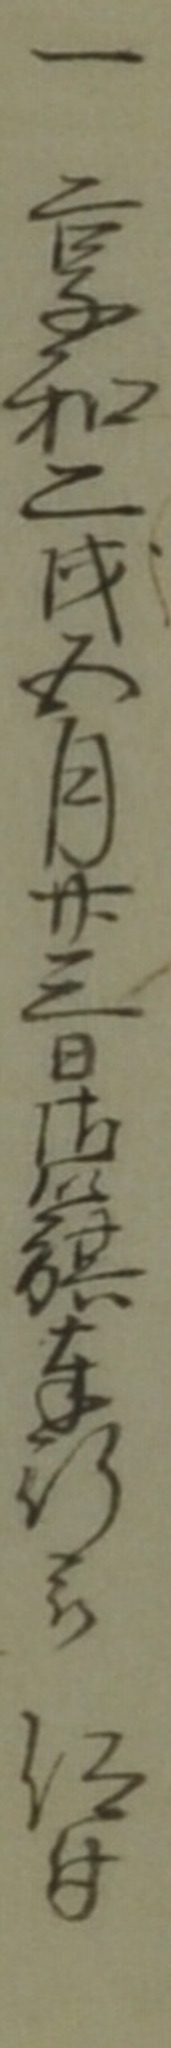一享和二戌五月廿三日御籏奉行被仰付
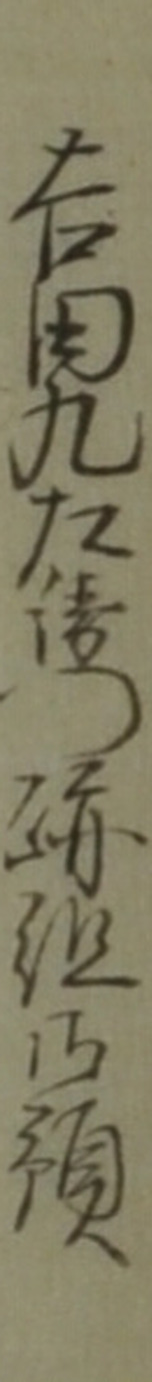一吉田九左衛門跡組御預
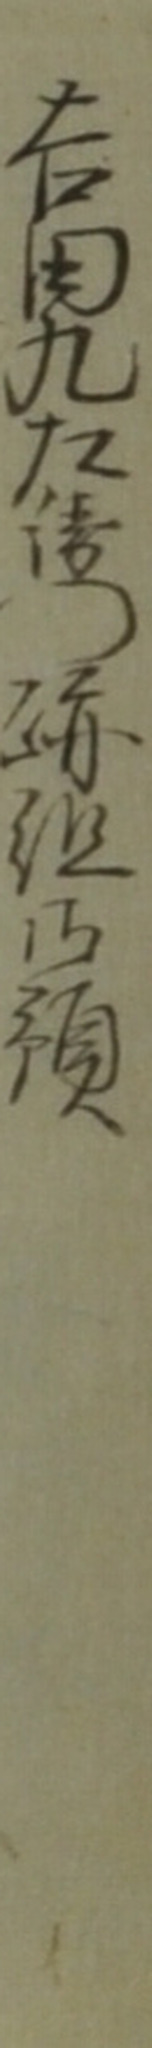一吉田九左衛門跡組御預
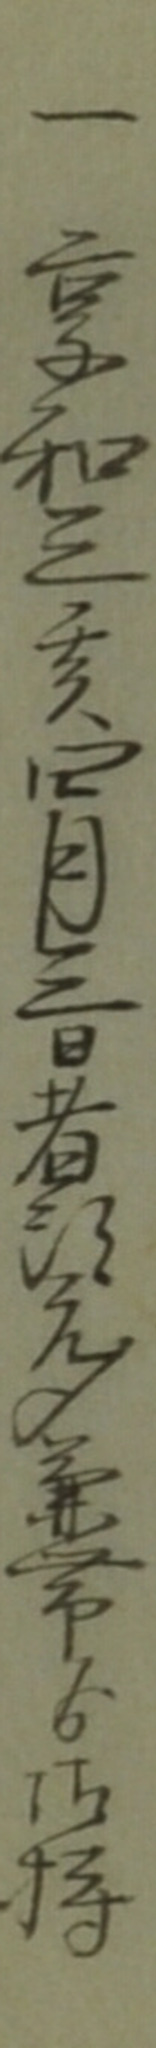一享和三亥正月四月三日者頭元〆兼帯ゟ御持
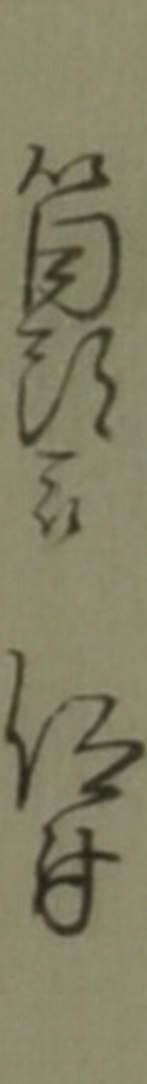筒頭被仰付
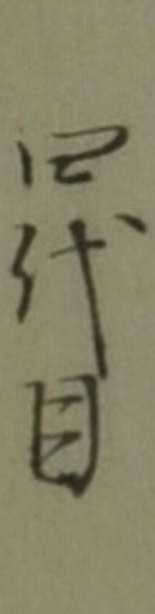四代目
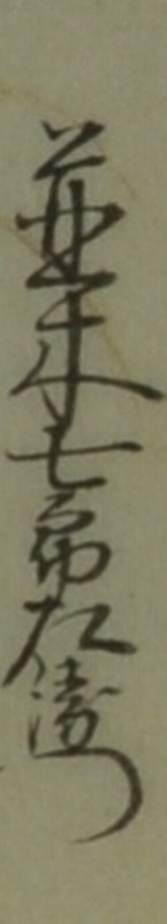並木七郎左衛門
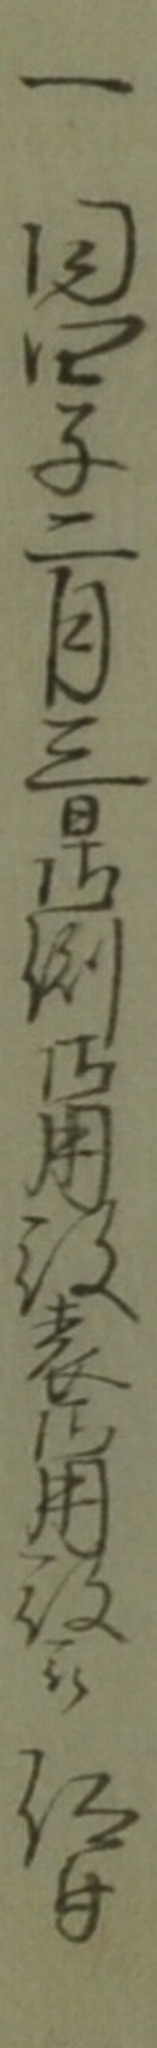一同四子二月三日御側御用役表御用役被仰付
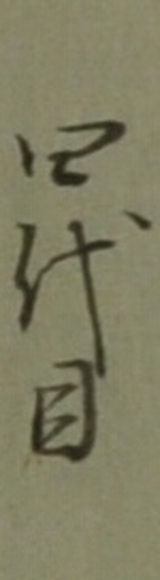四代目
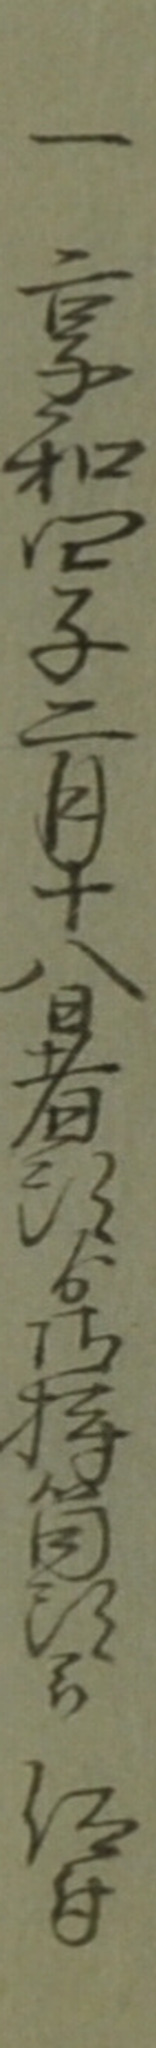一享和四子二月十八日者頭ゟ御持筒頭被仰付
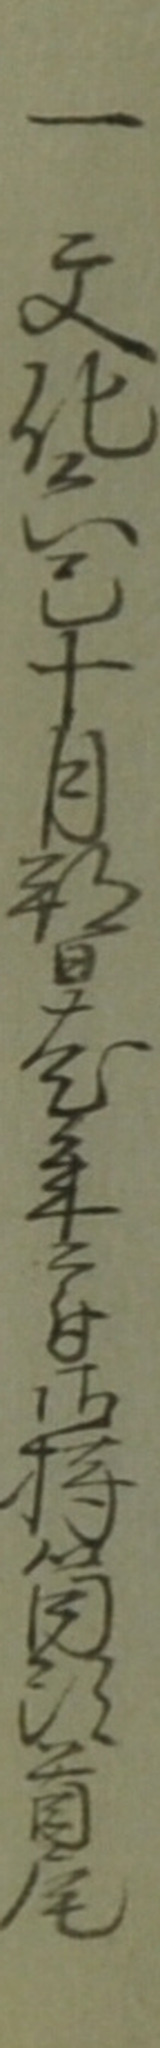一文化六巳十月朔日老年ニ付御持筒頭首尾
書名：諸御役代々録（二）
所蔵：伊那市立高遠町図書館・合同会社AMANE
